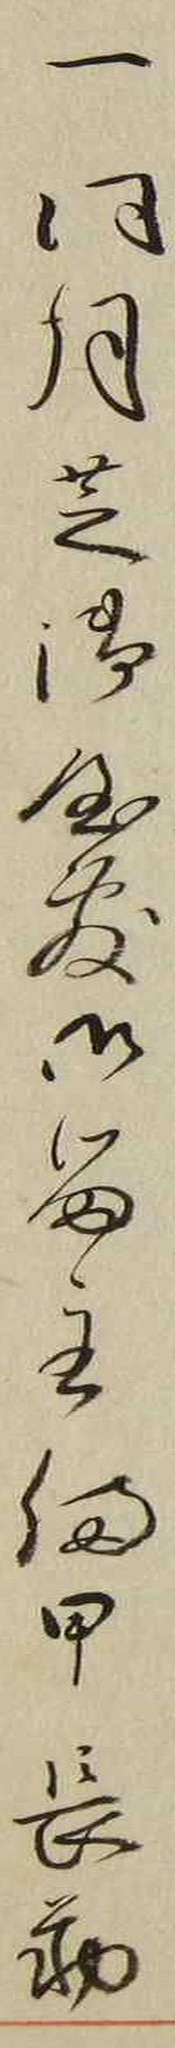一同月芝御屋敷御留主備甲長勤

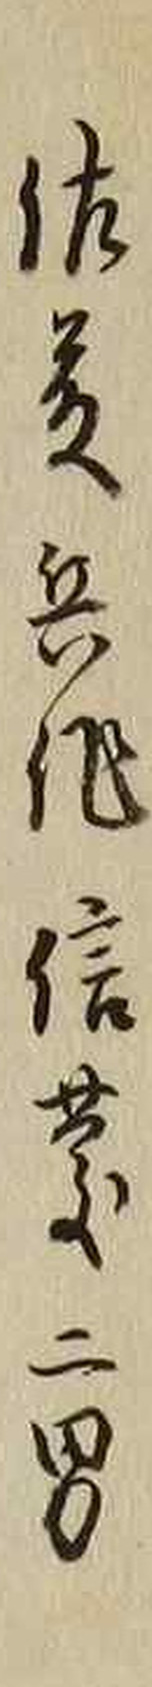佐藤兵作信慶二男
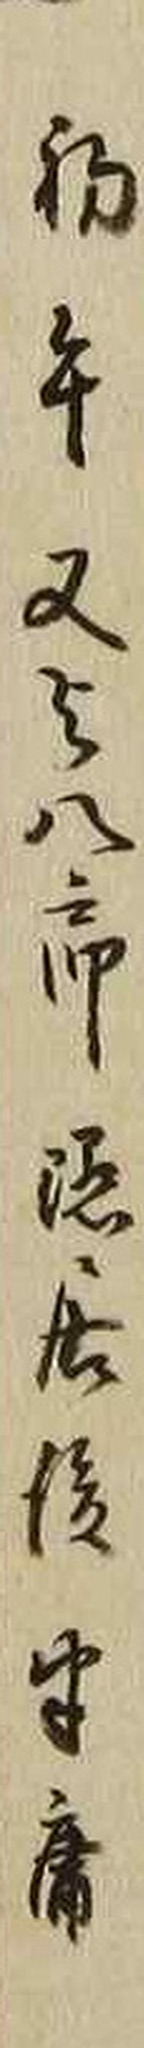初年又与八郎隠居後半庸
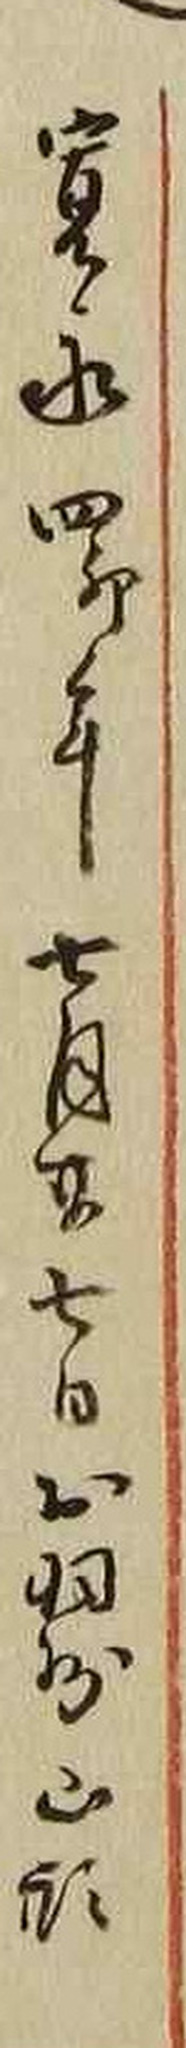寛永四卯年七月廿七日於羽州山形誕生
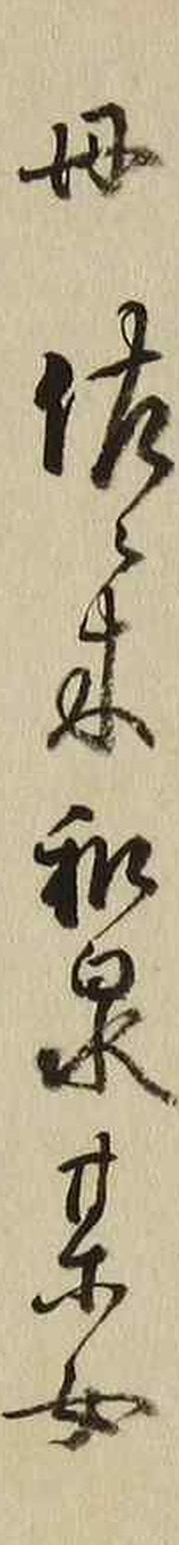母佐々木和泉女
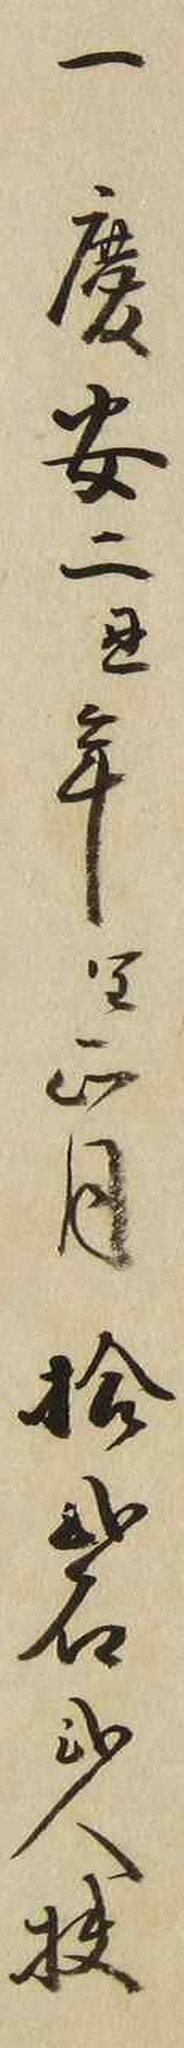一慶安二年丑閏正月拾弐石弐人扶

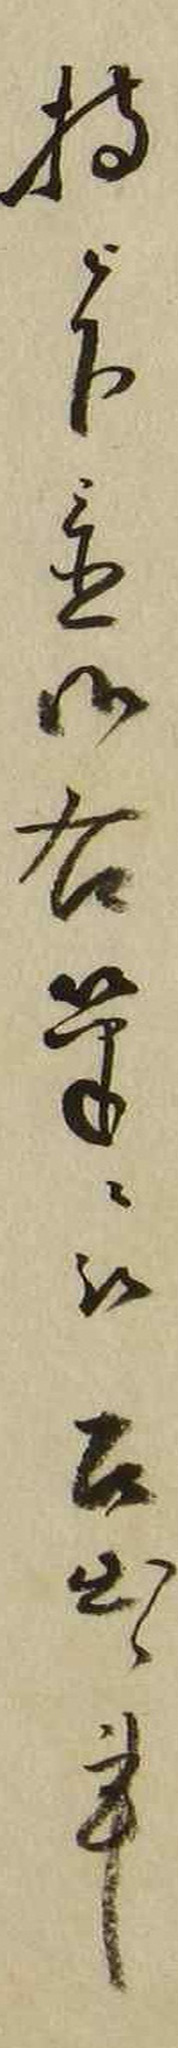持被下置御右筆ニ被召出候事
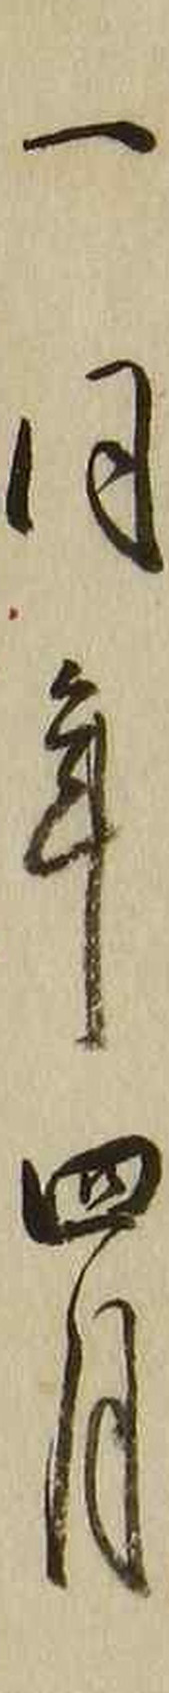一同年四月
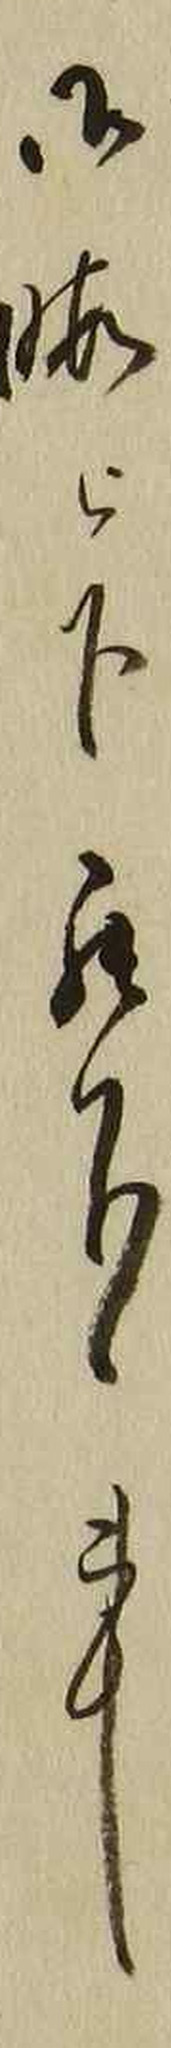御暇被下罷下候事

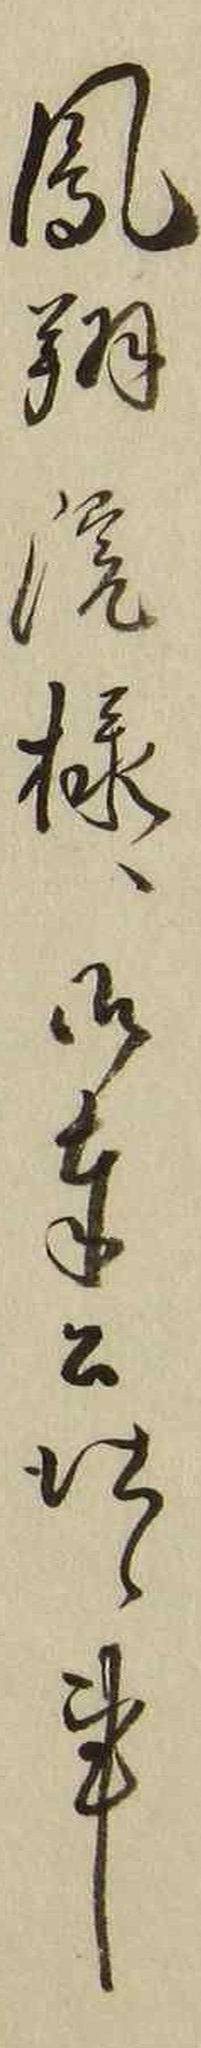鳳翔院様へ御奉公仕候事
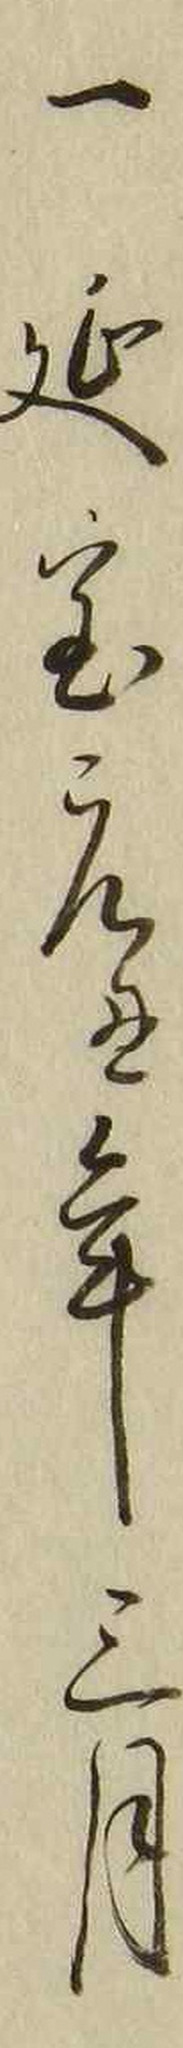一延宝元丑年三月
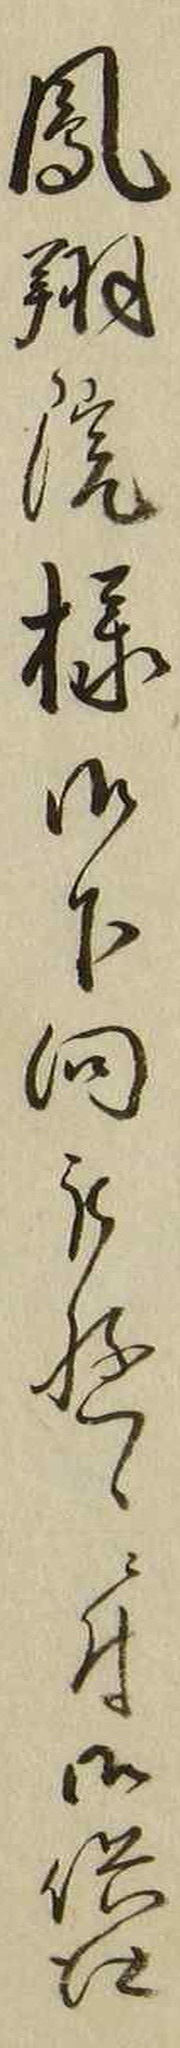鳳翔院様御下向被遊候ニ付御供仕
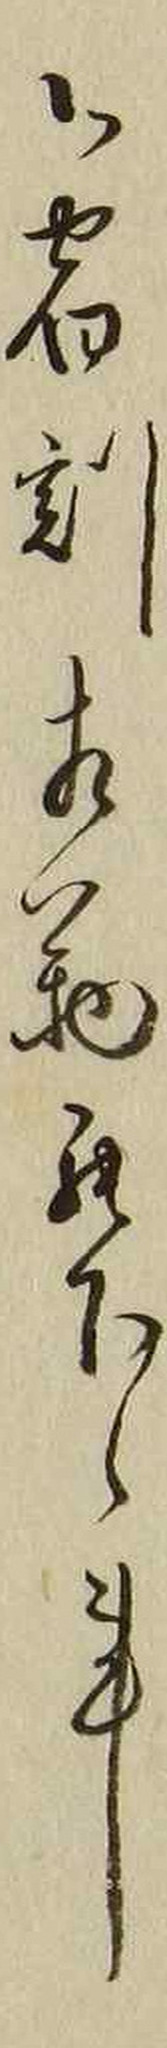御宿割相勤罷下候事
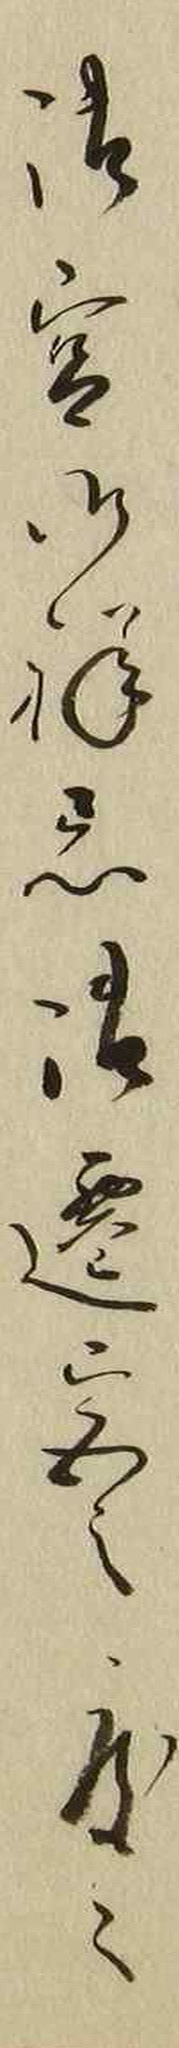御宮御祥忌御遷宮之度々
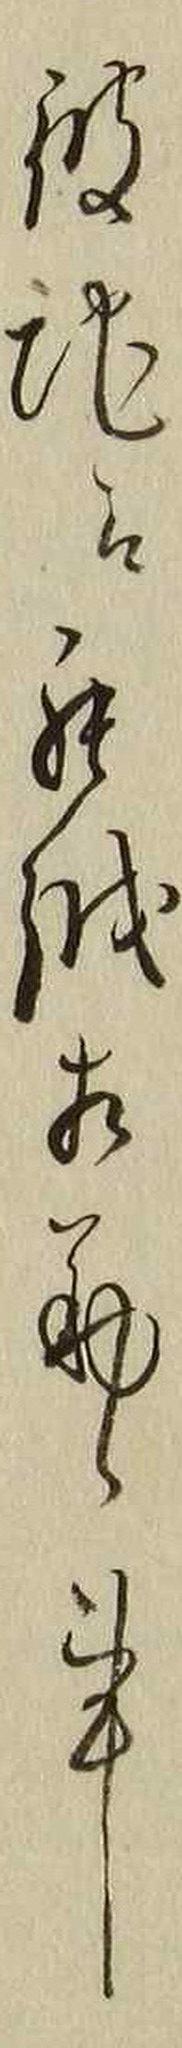彼地江罷越相勤候事
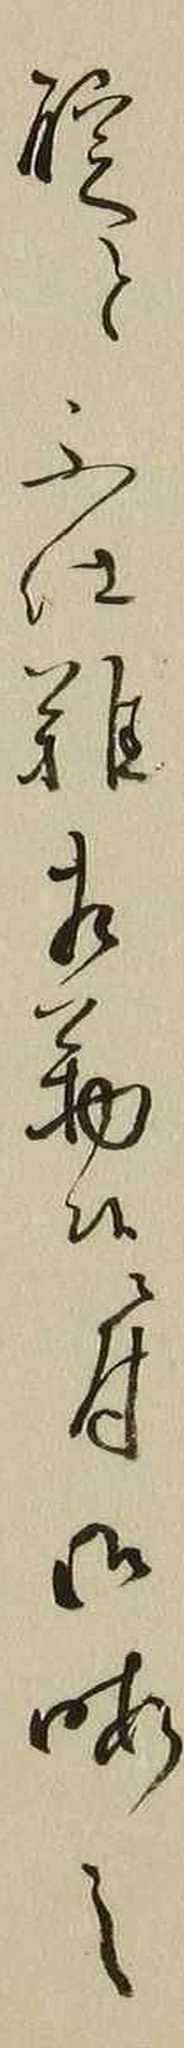聢と不仕難相勤候ニ付御暇之
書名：諸士系譜　巻之1　い之部1
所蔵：会津若松市立会津図書館
